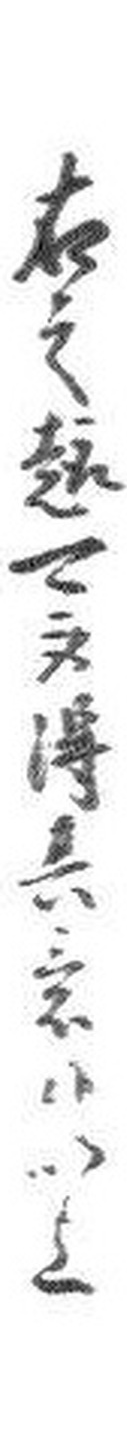右之趣可被得其意候以上
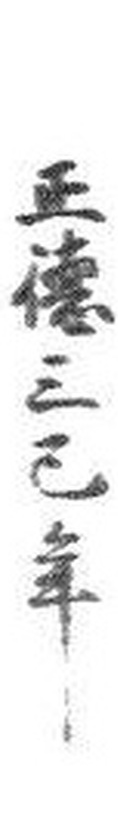正徳三巳年
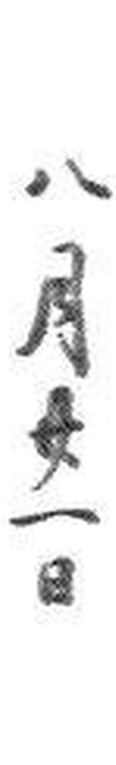八月廿一日

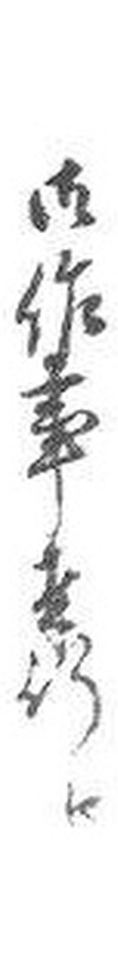御作事奉行江
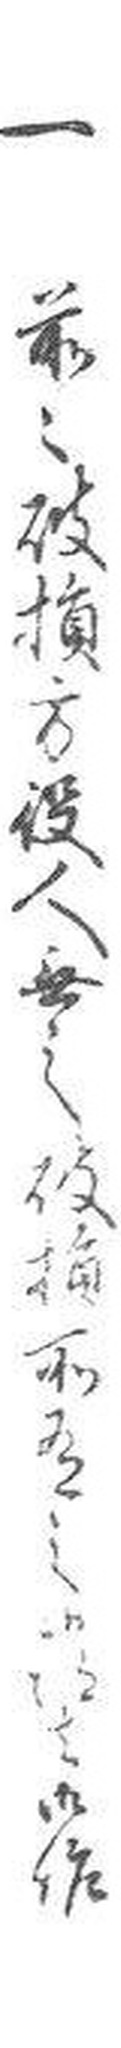一前々破損方役人無之破損所有之候得者御作
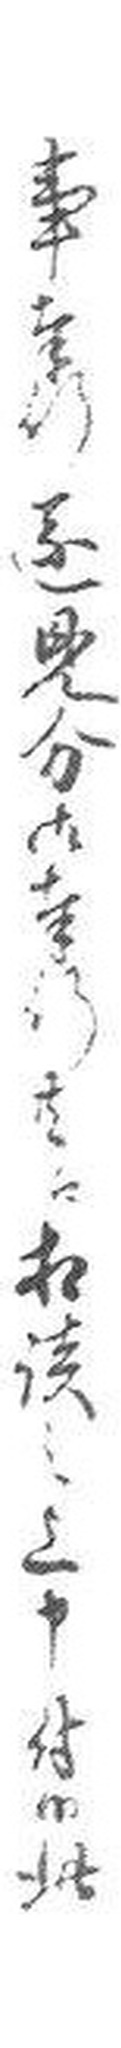事奉行遂見分御奉行共江相談之上申付候此
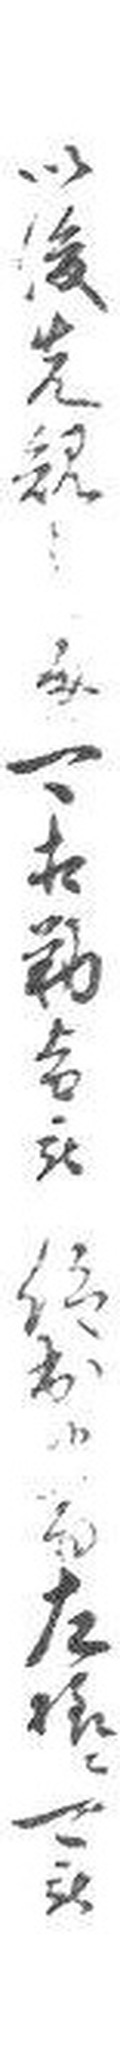以後先規之義可相勤旨被仰出候間左様ニ可被
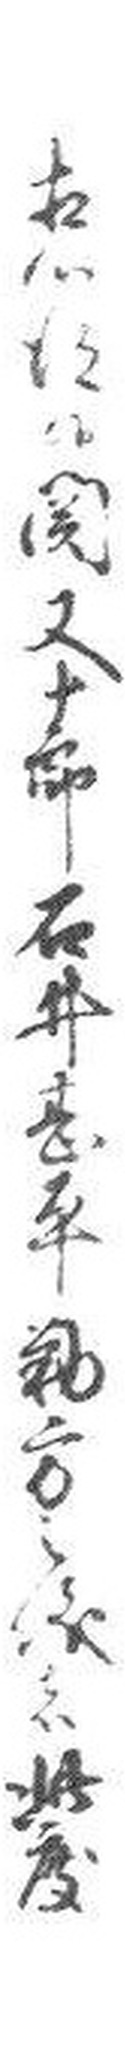相心得候関又十郎石井甚平勤方之儀者此度
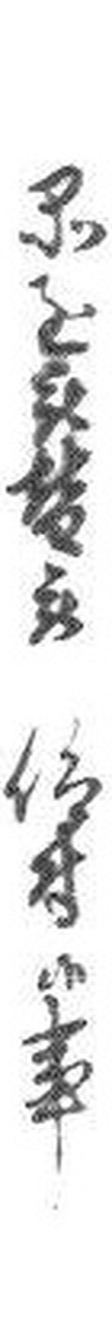品を被替被仰付候事
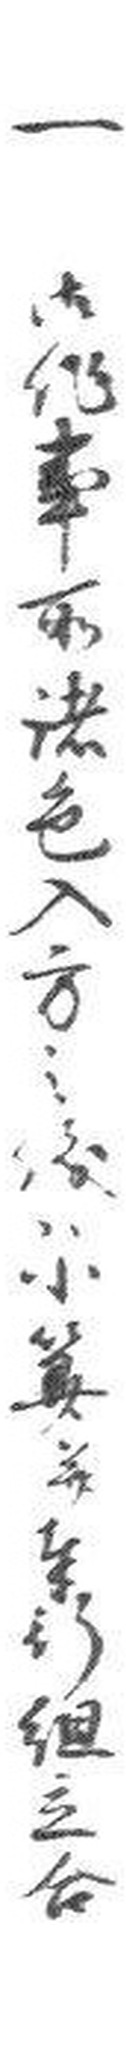一御作事所諸色入方之儀ハ小算并奉行組立合
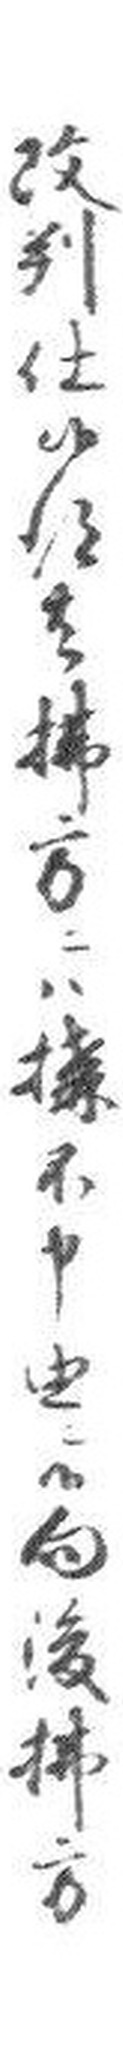改判仕候得共払方ニハ構不申由ニ而向後払方
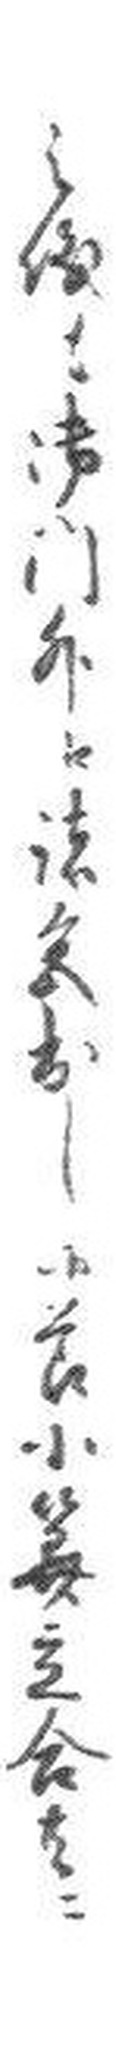之儀も御門外江諸色出し候節小算立合共ニ
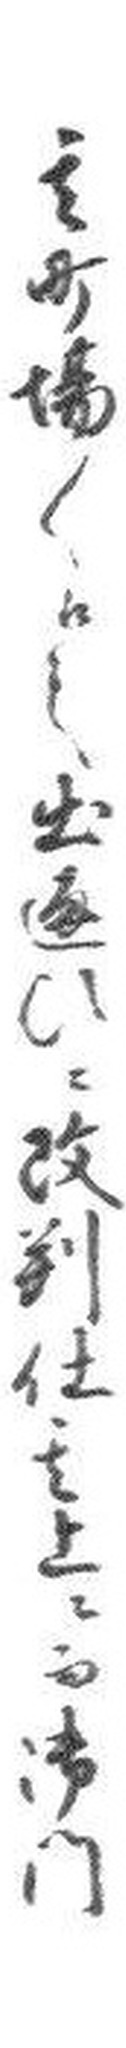其町場〳〵江之出通ひニ改判仕其上ニ而御門
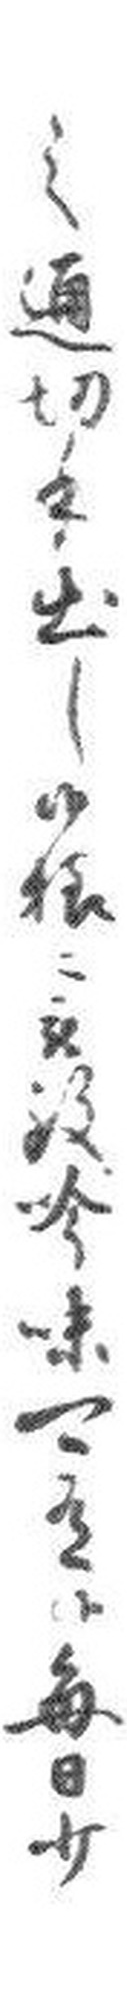之通切手出し候様ニ被致吟味可有候毎日少
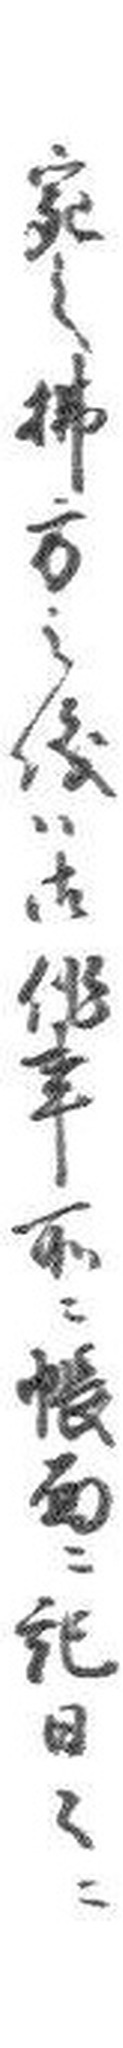宛之払方之儀ハ御作事所ニ帳面ニ記日〳〵ニ
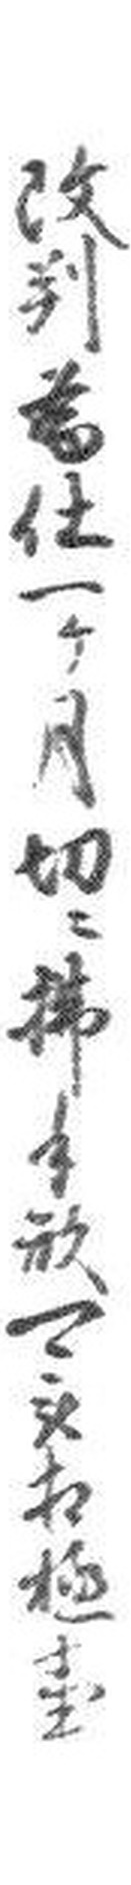改判為仕一ヶ月切ニ払手形可被相極事
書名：家譜 二十九 吉邦公 従正徳二年到正徳三年
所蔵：福井県文書館 Fukui Prefectural Archives
